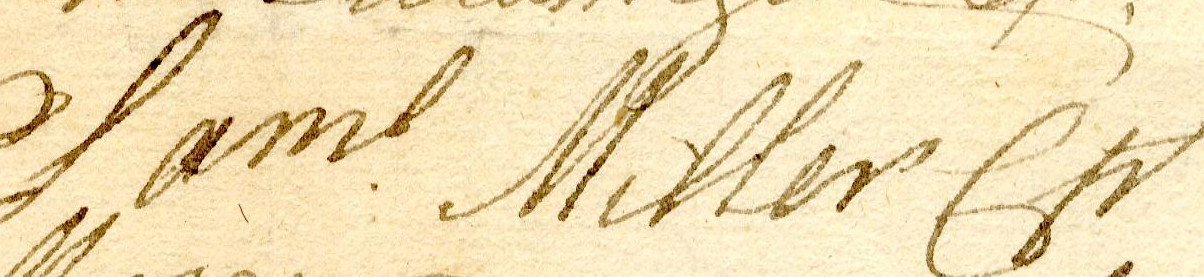Sam^l. Miller Cpt
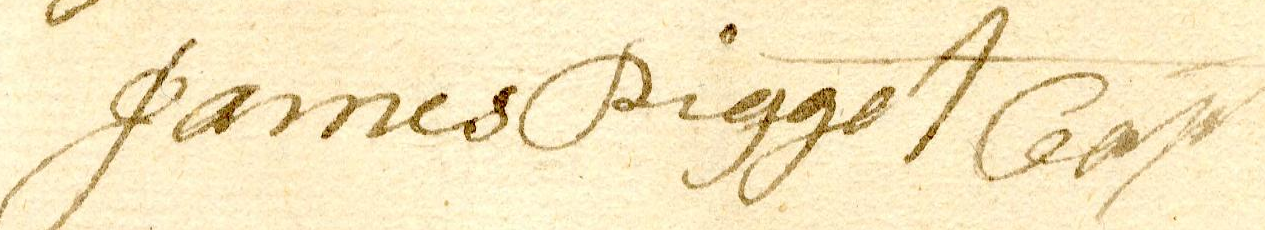James Pigget Capt
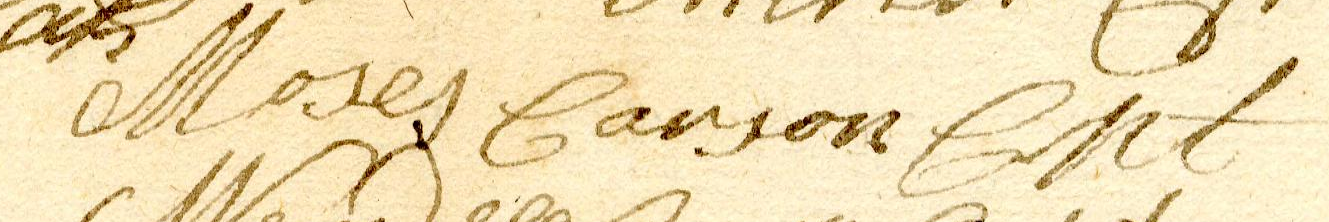Moses Carson Cpt
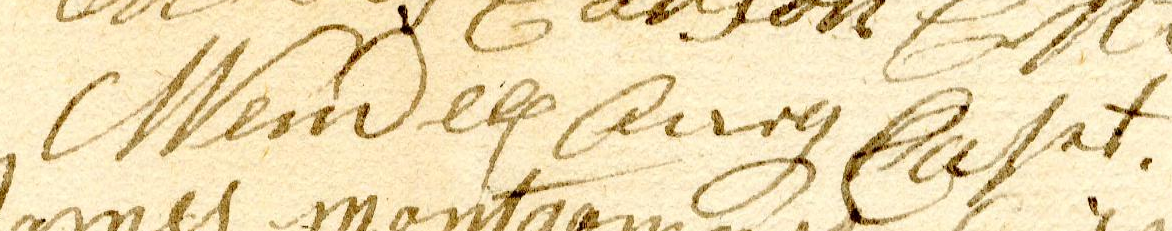Wendell Oury Capt.
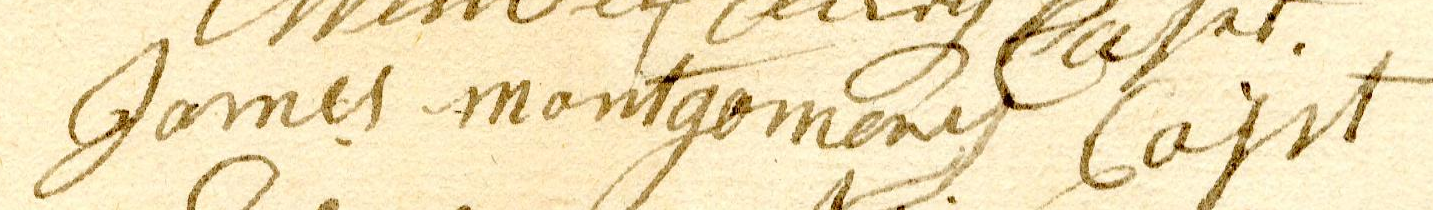James Montgomery Capt
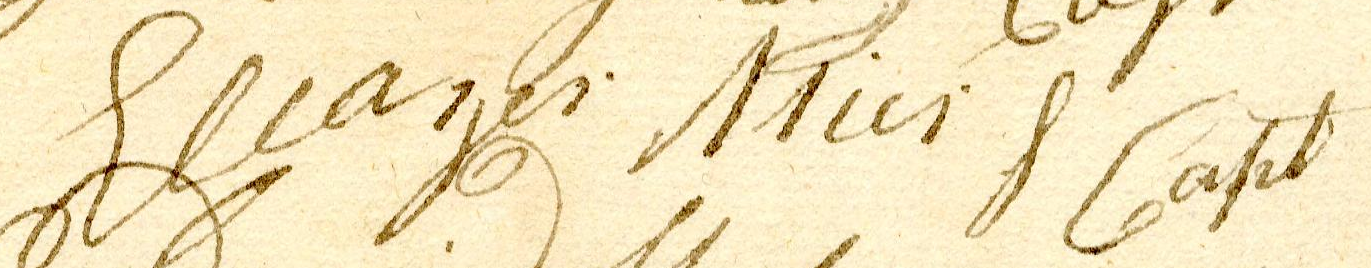Eleazer Mier, Capt
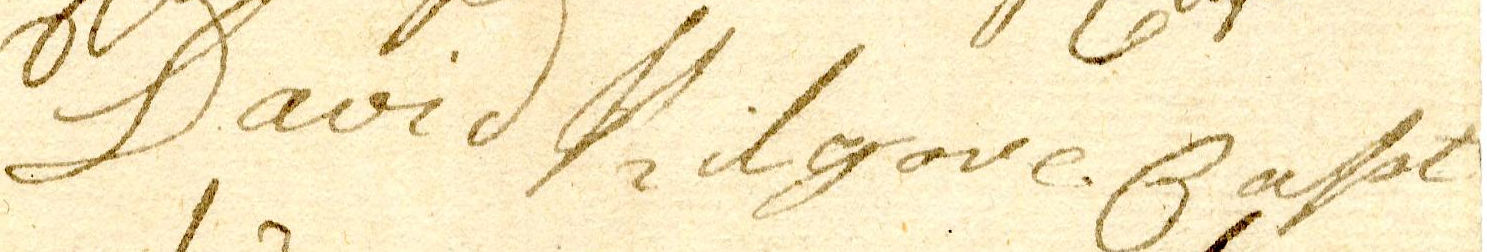David Wilgrove Capt
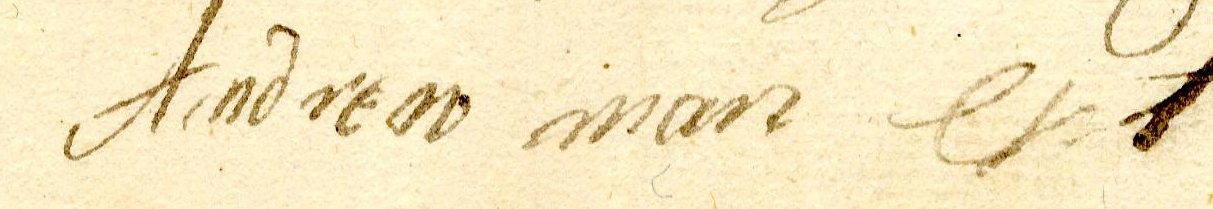Andrew man Cpt
